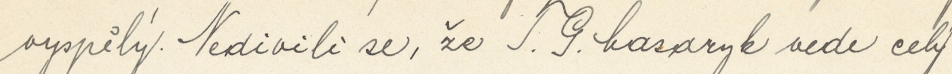vyspělý. Nedivili se, že T. G. Masaryk vede celý
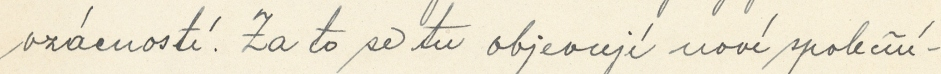vzácností. Za to se tu objevují noví společní-
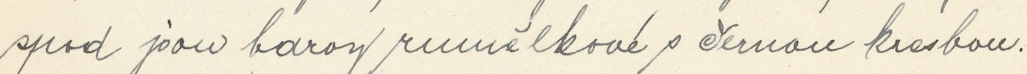spod jsou barvy rumělkové s černou kresbou.
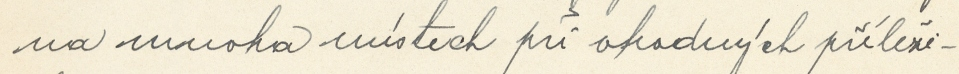na mnoha místech při vhodných příleži-
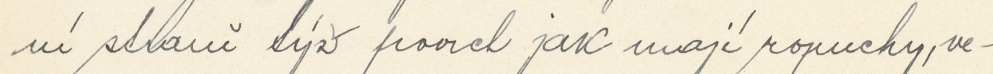ní straně týž povrch jak mají ropuchy, ve-
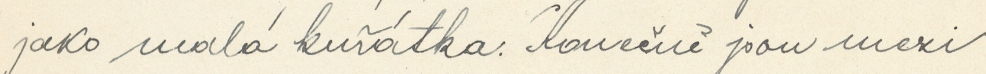jako malá kuřátka. Konečně jsou mezi
